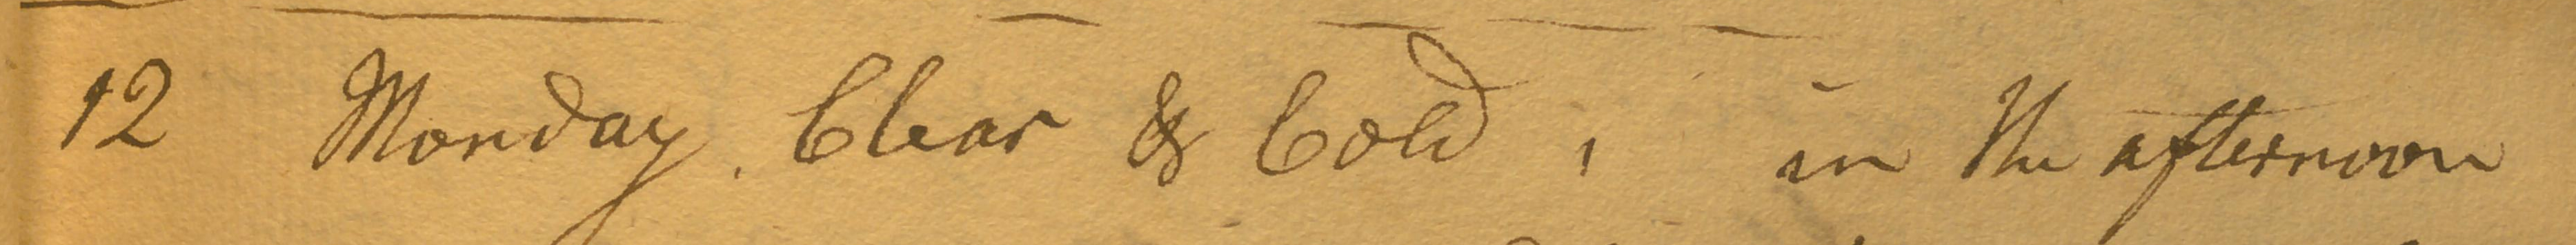12 Monday Clear & Cold, in the afternoon
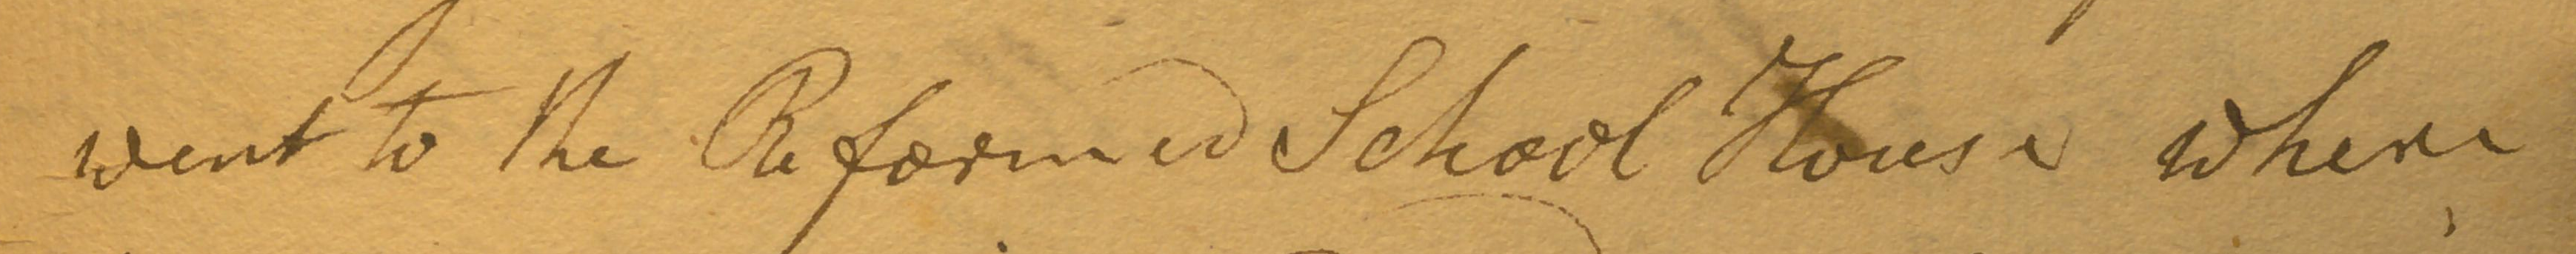went to the Reformed School House where
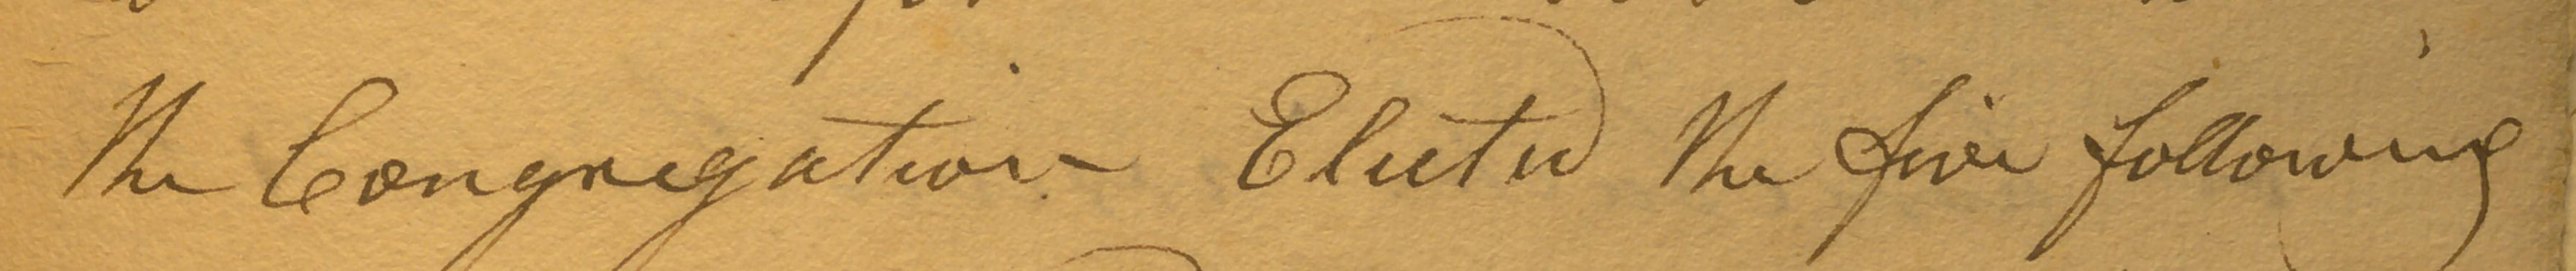the Congregation Elected the five following
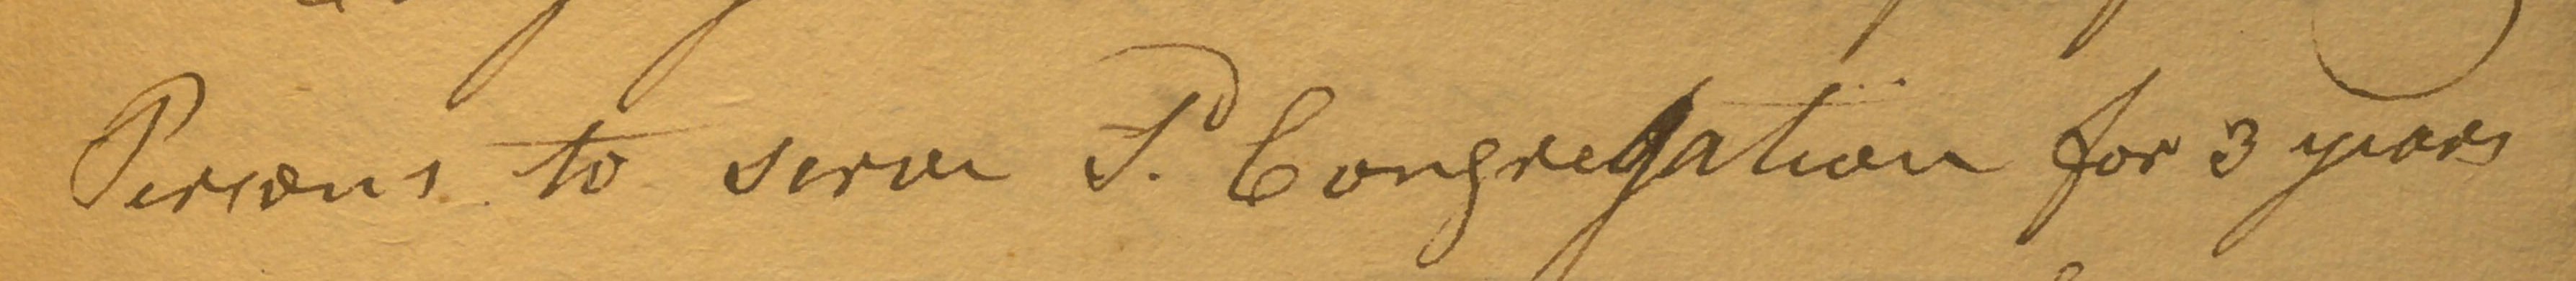Persons to serve s^d. Congregation for 3 years
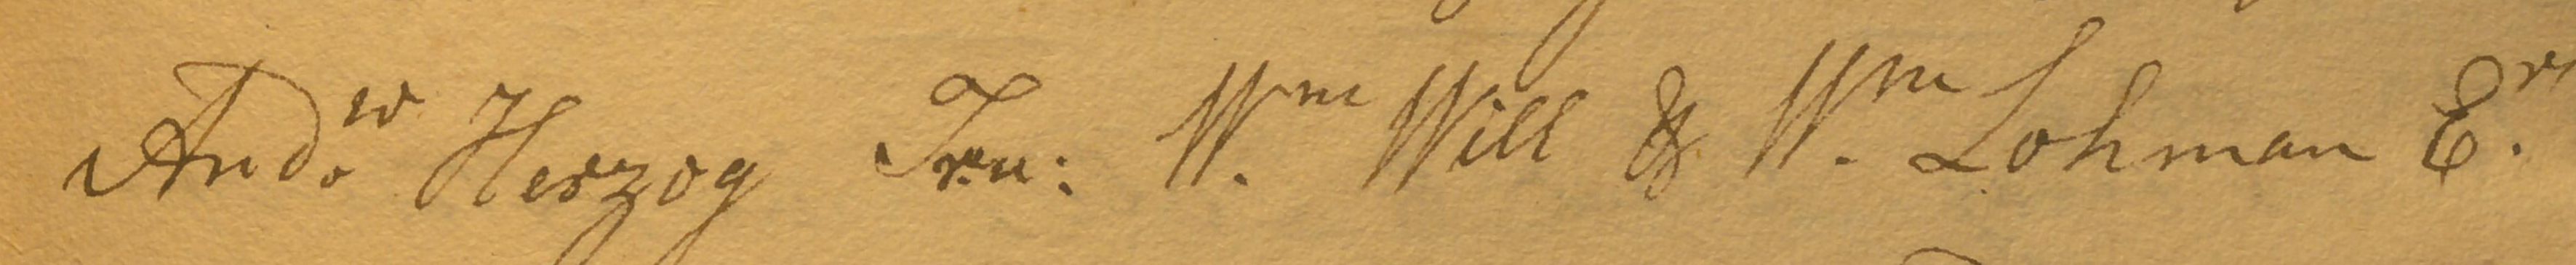And^w. Herzog Tru: W^m. Will & W^m. Lohman E^rs.
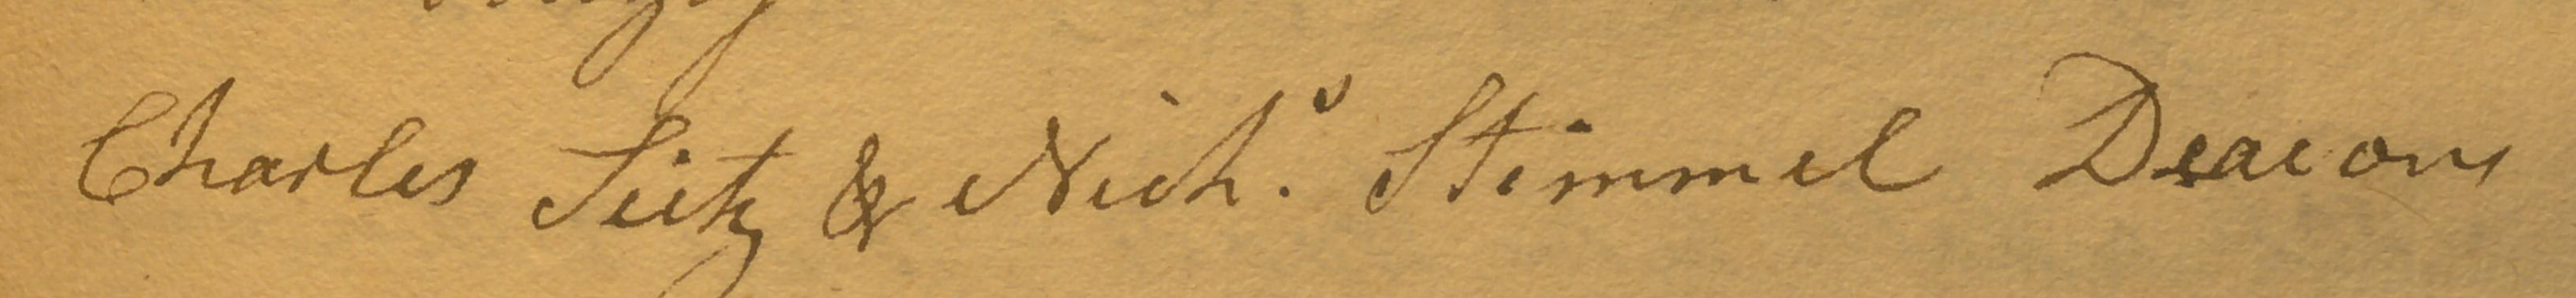Charles Sietz & Nichs. Stimmel Deacons
